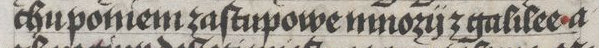chu poniem zaſtupowe mnozij z galilee.a¬
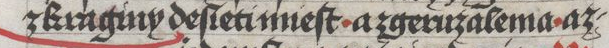zkraginy deſieti mieſt.a zgeruzalema.a z¬
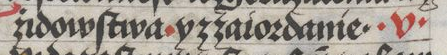żidowſtwa.y z zaiordaníe.v.
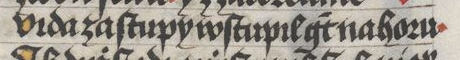vida zaſtupy wſtupil ḡt nahoru.
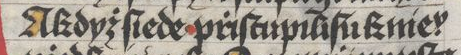Akdyż ſiede.pṙiſtupili ſu k kniev
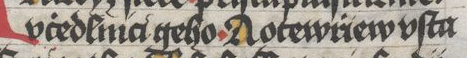vċedlníci geho.A otewṙiew vſta¬
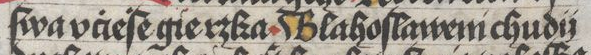ſwa vċieẛe gie rzka.Blahoſlawení chudij
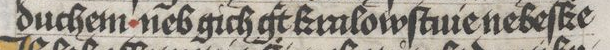duchem.neb gich ḡt kralowſtuíe nebeſke
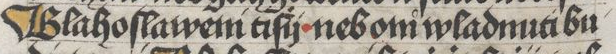Blahoſlaweni tiẛij.neb oni wladnuti bu¬
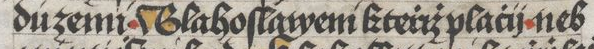du zemi.Blahoſlawení kteṙi plaċij.neb
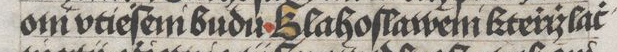oni vtieẛeni budu.Blahoſlaweni ktreṙiż laċ¬
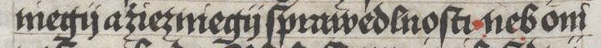niegij a żiezniegij ſprawedlnoſti.neb oni
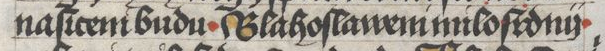naſiceni budu.Blahoſlaweni miloſrdnij.
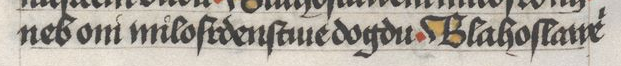neb oni miloſrdenſtuie dogdu.Blahoſlawe¬
